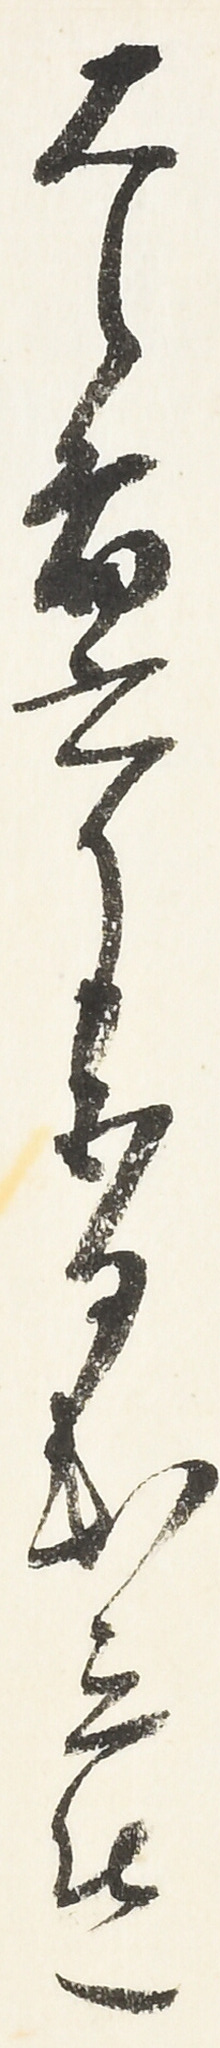右之者六月五日出立仕候
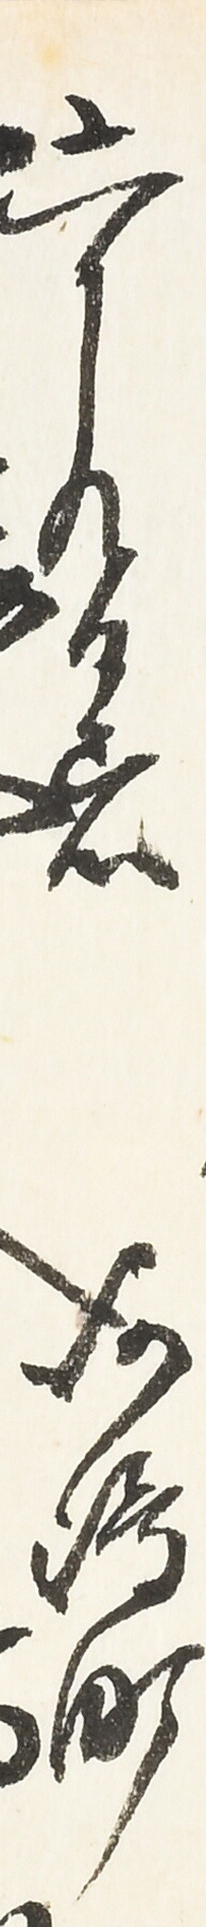六月九日着阿嶋町
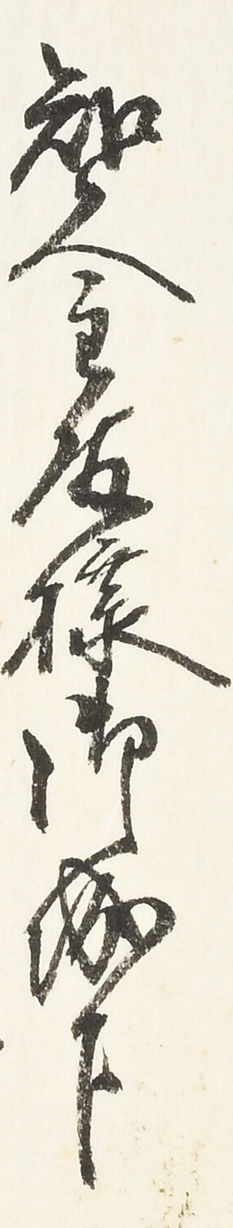知久主殿様御城下
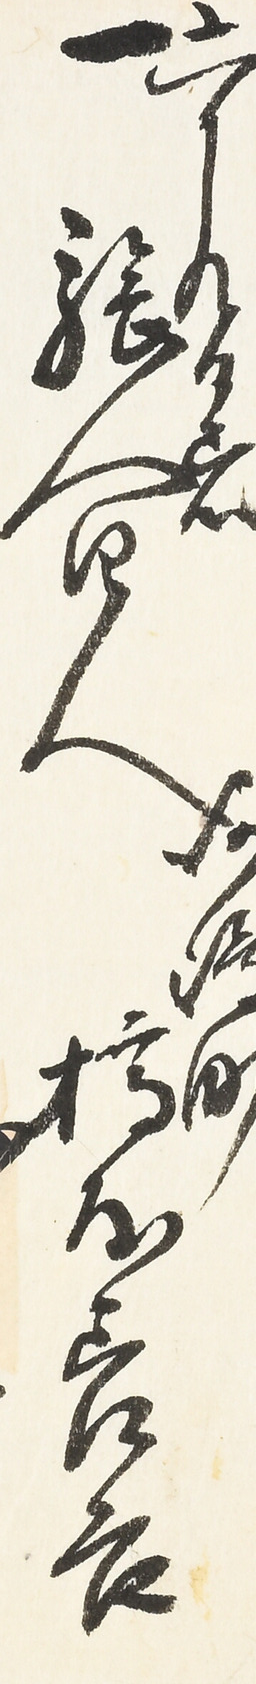一旅人四人槁屋善吉
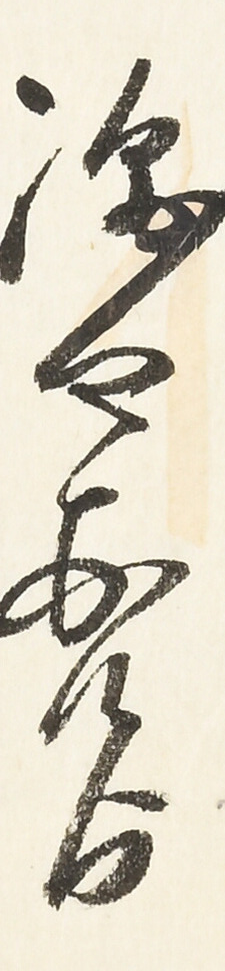綿や安左衛門
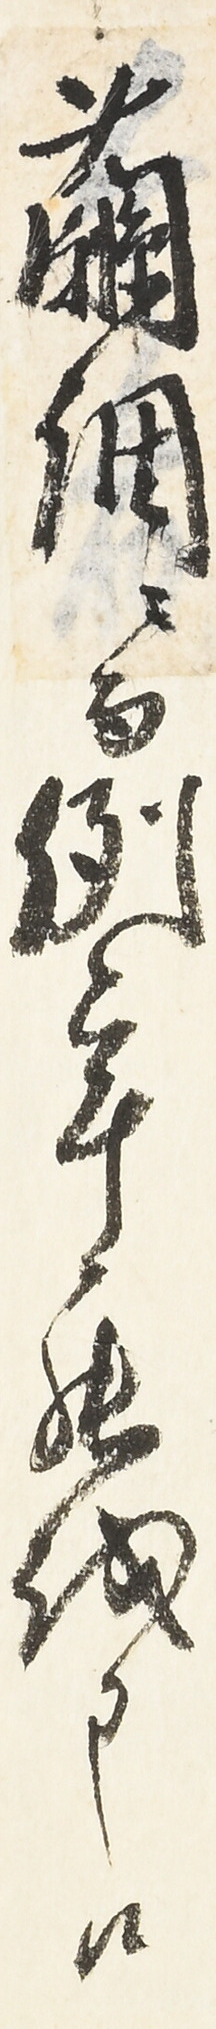繭調ニ而例年罷越申候
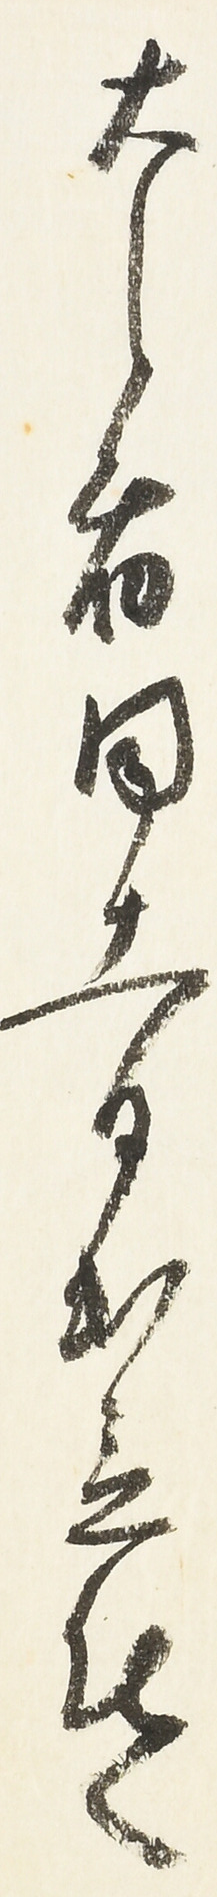右之者同十一日出立仕候
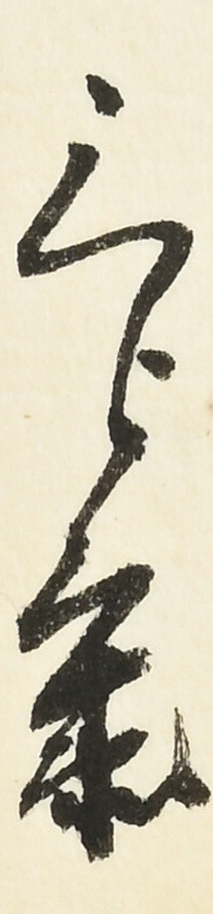三郎兵衛
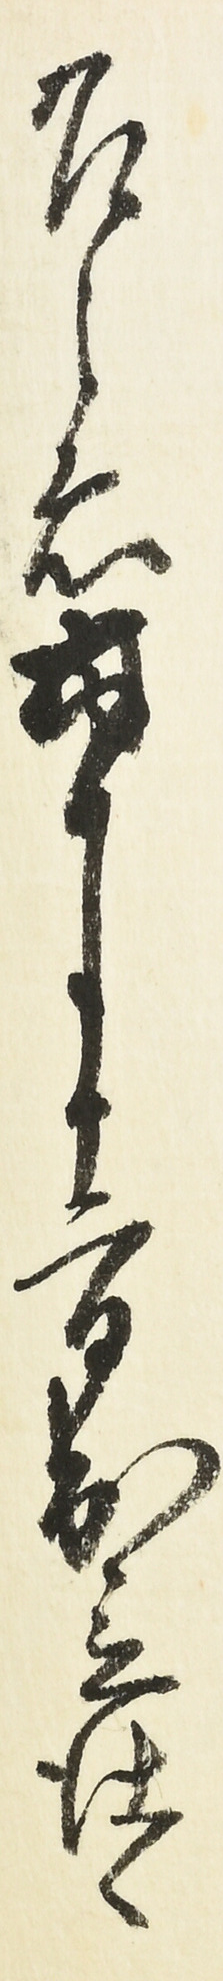右之者同十一日出立仕候

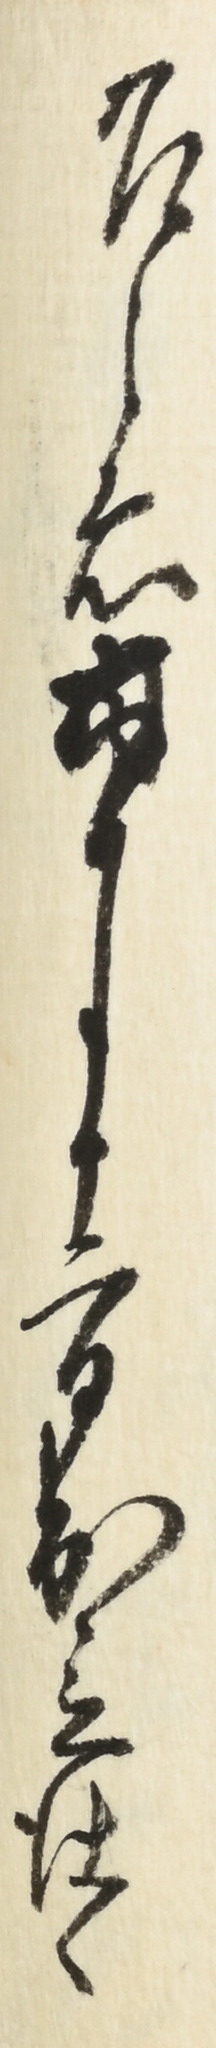右之者同十九日出立仕候
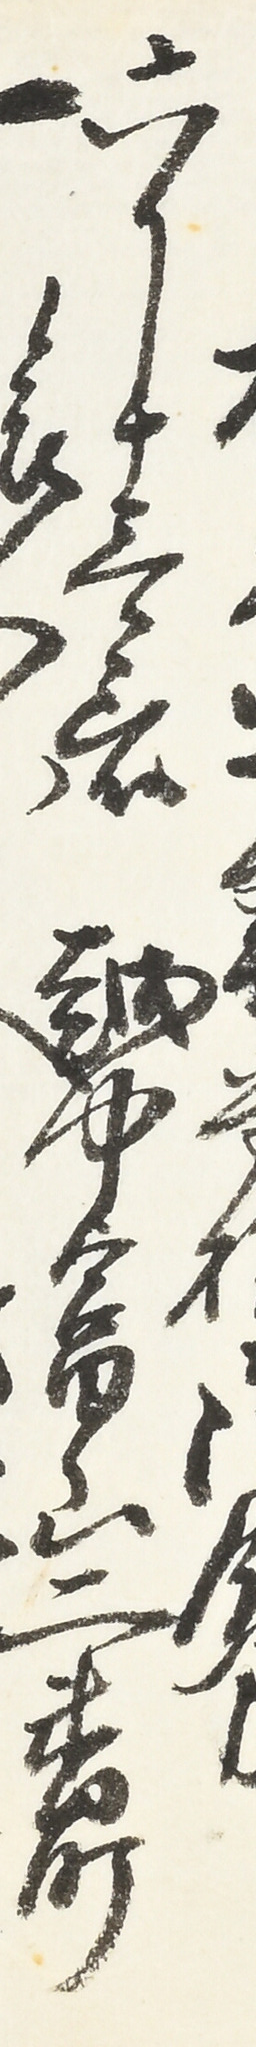六月十三日着越中富山二番町
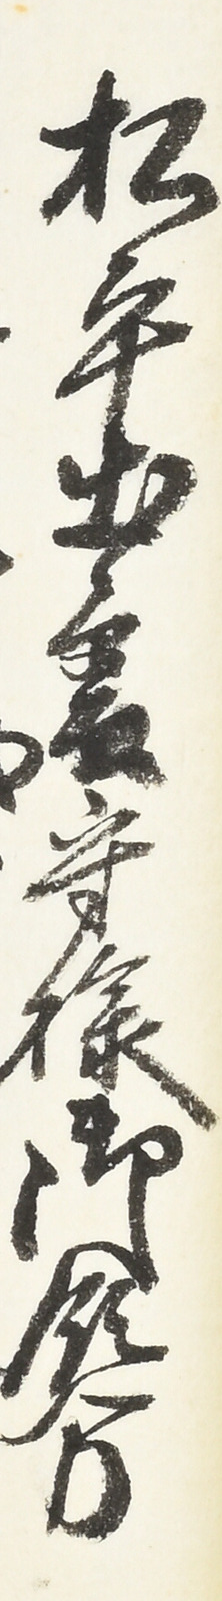松平出雲守様御領分
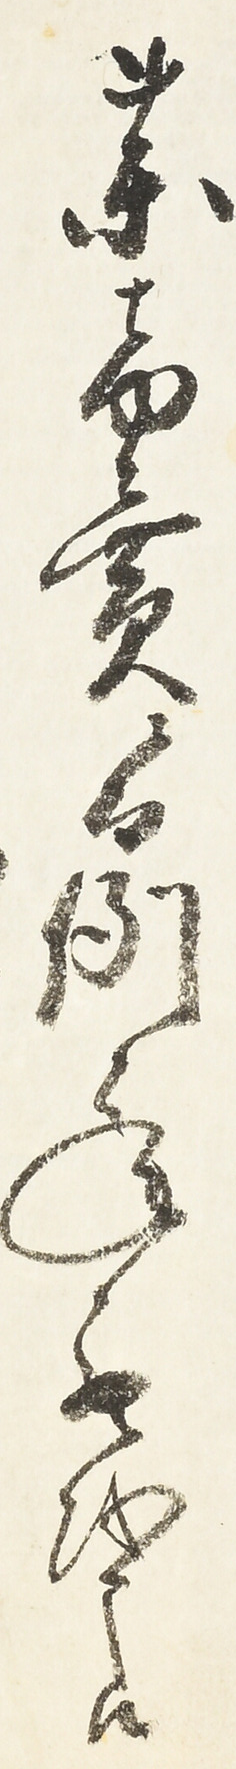薬商売ニ而例年罷越申候
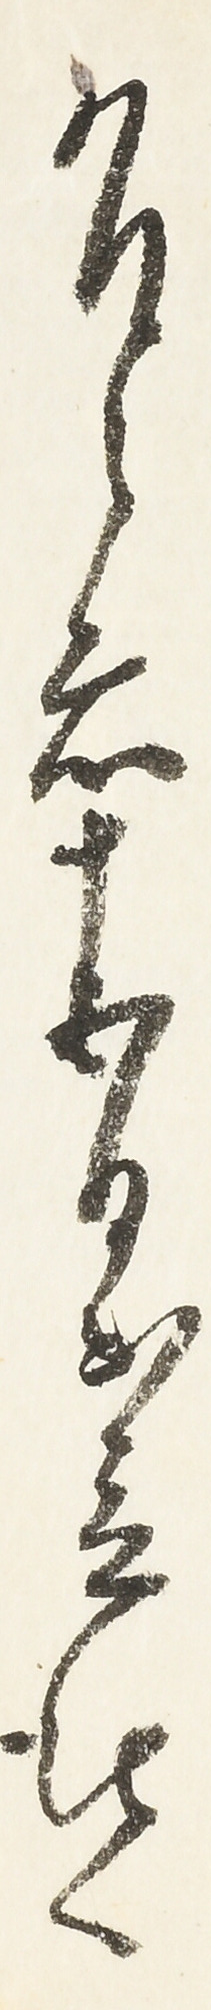右之者十五日出立仕候
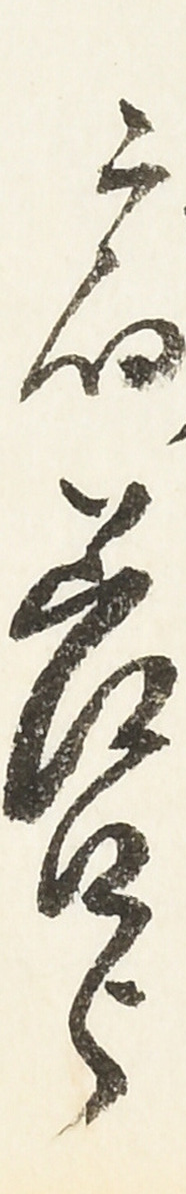宿善四郎
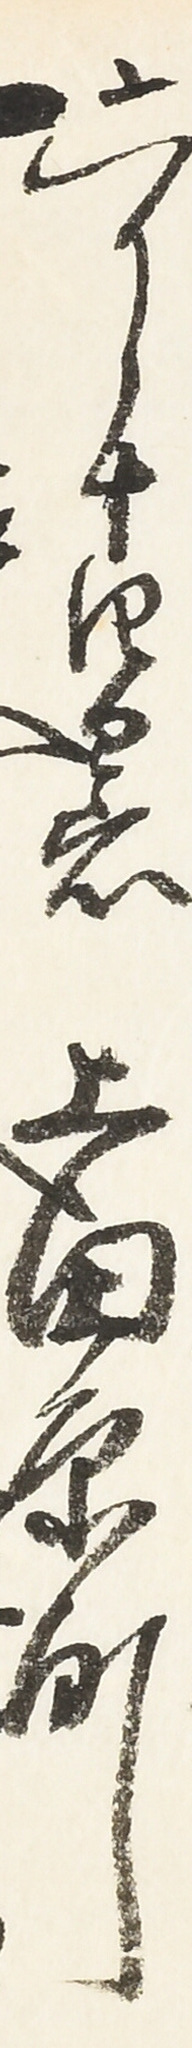六月十四日着上田原町
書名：町中旅人泊控帳
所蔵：伊那市立高遠町図書館・合同会社AMANE
